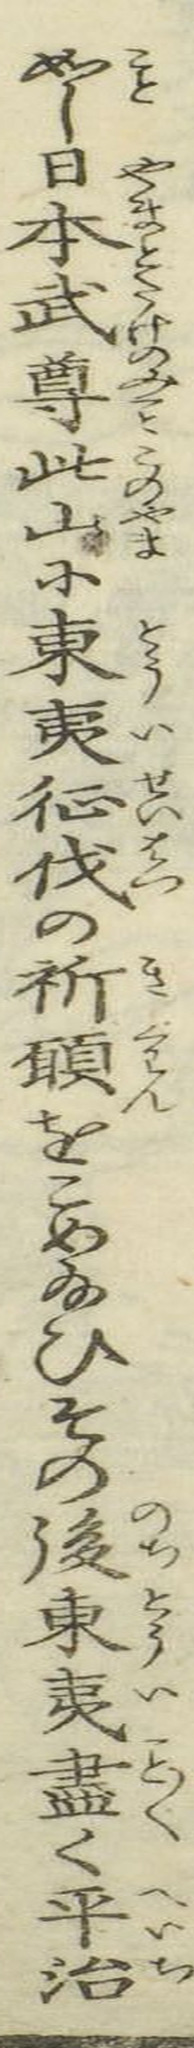如し日本武尊此山に東夷征伐の祈願をこめ給ひその後東夷尽く平治
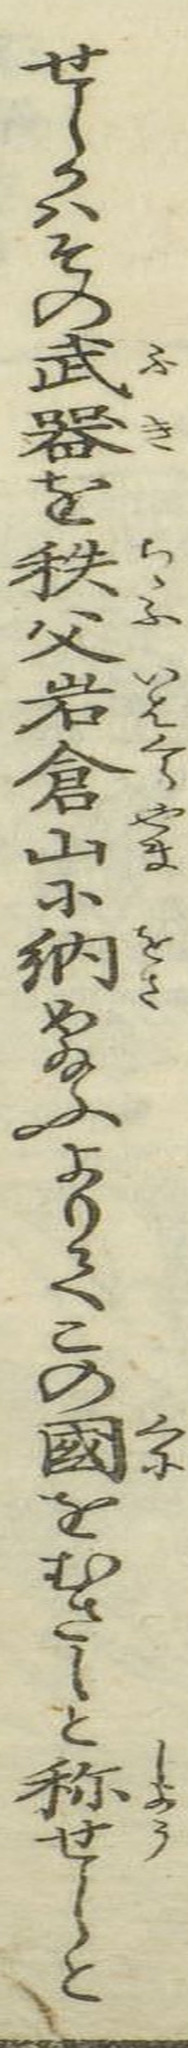せしかはその武器を秩父岩倉山に納め給ふよりてこの国をむさしと称せしと
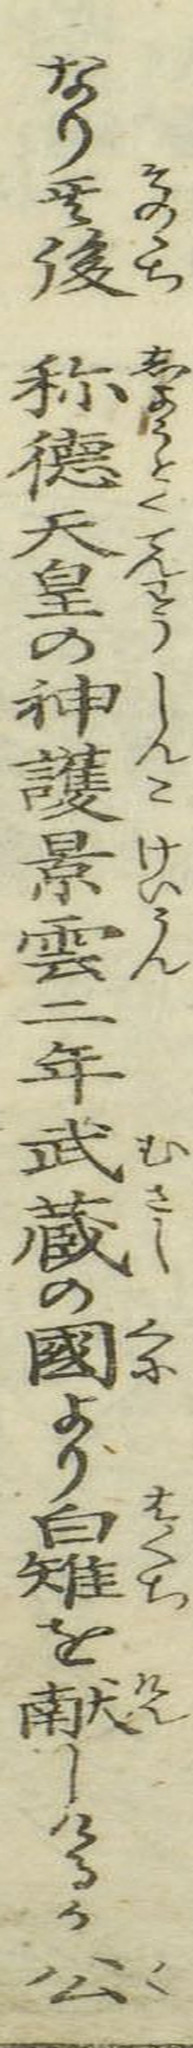なり其後称徳天皇の神護景雲二年武蔵の国より白雉を献しけるか公
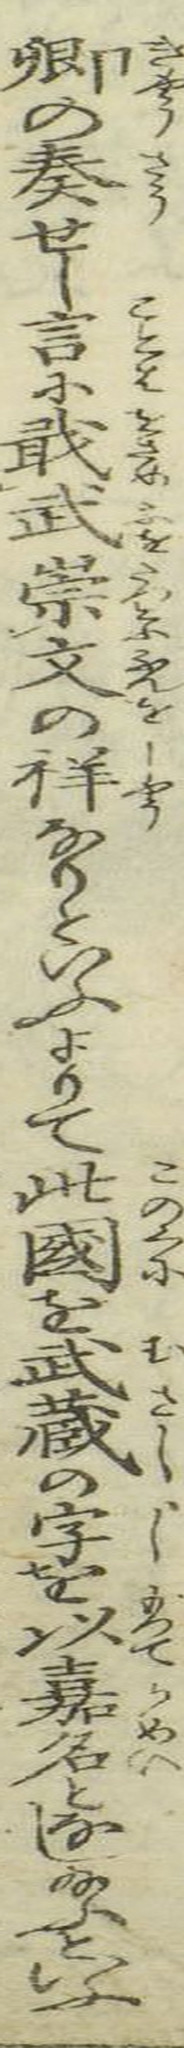卿の奏せし言に戢武崇文の祥なりといふよりて此国を武蔵の字を以嘉名となし給ふといふ
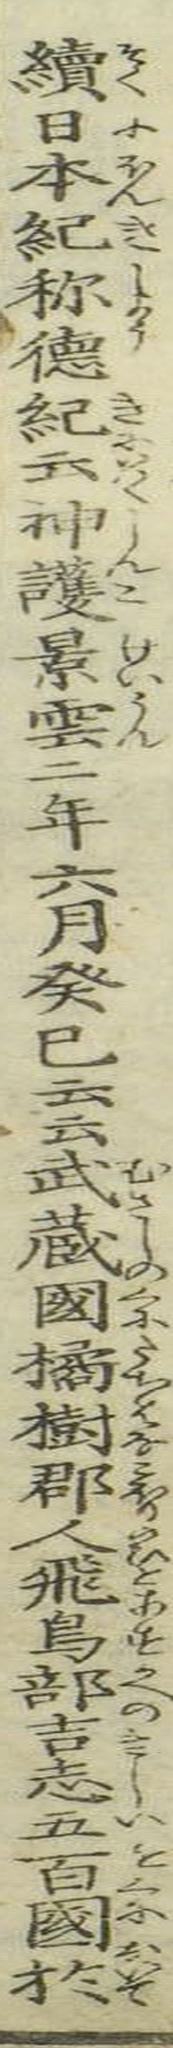続日本紀称徳紀云神護景雲二年六月癸巳云云武蔵国橘樹郡人飛鳥部吉志五百国於

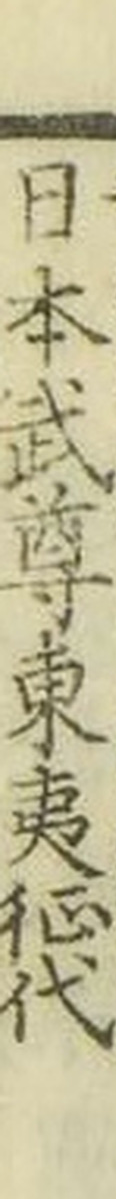日本武尊東夷征代
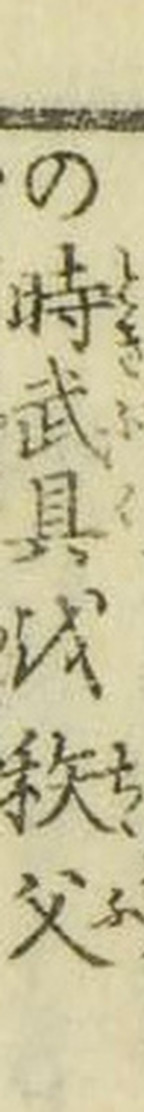の時武具を秩父
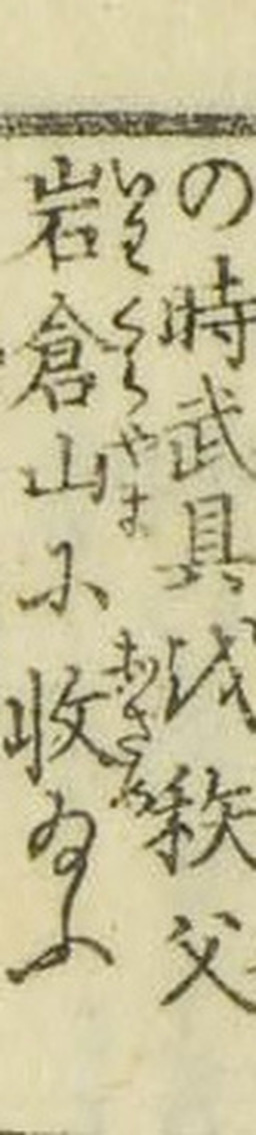岩倉山に収給ふ
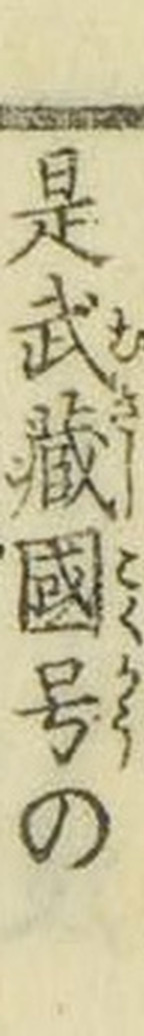是武蔵国号の
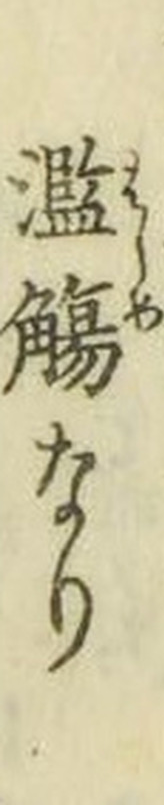濫觴なり
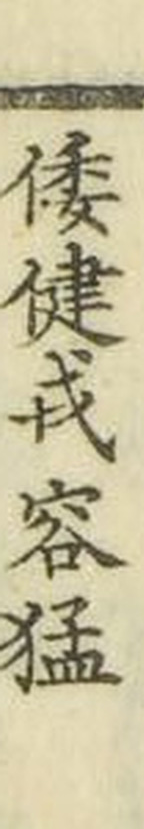倭健戎容猛
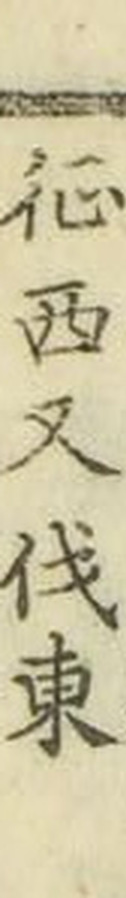征西又伐東
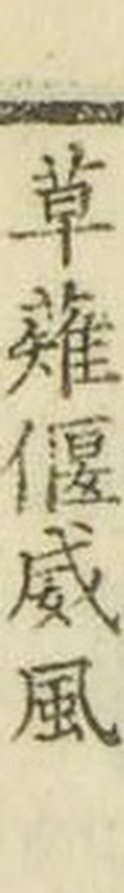草薙偃威風
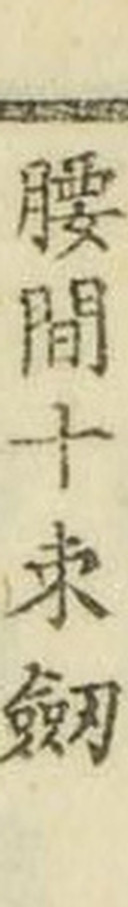腰間十束剣
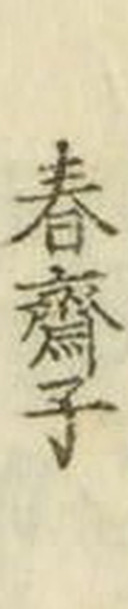春斎子

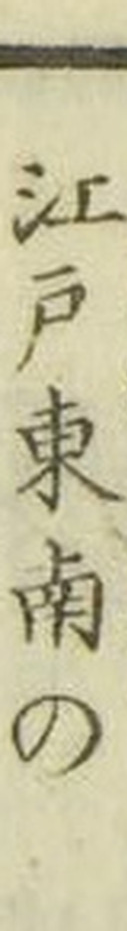江戸東南の
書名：江戸名所図会 20巻 巻之1
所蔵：東京学芸大学教育コンテンツアーカイブ
